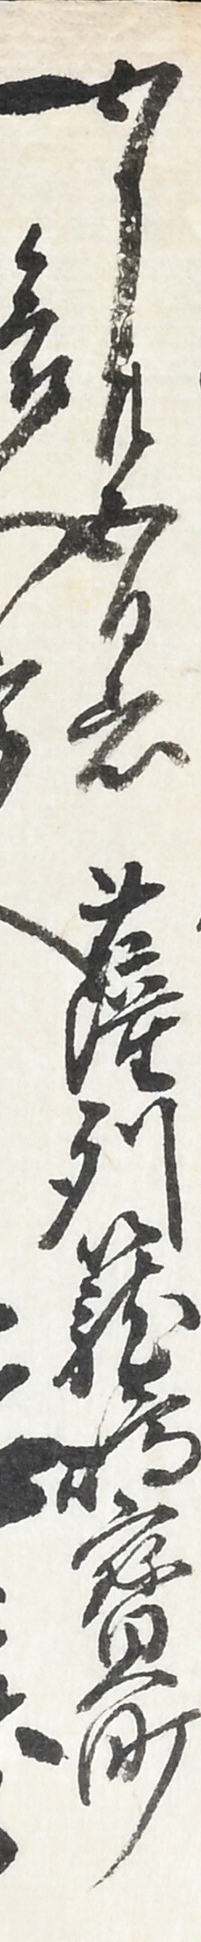五月廿五日着薩州籠嶋宝町
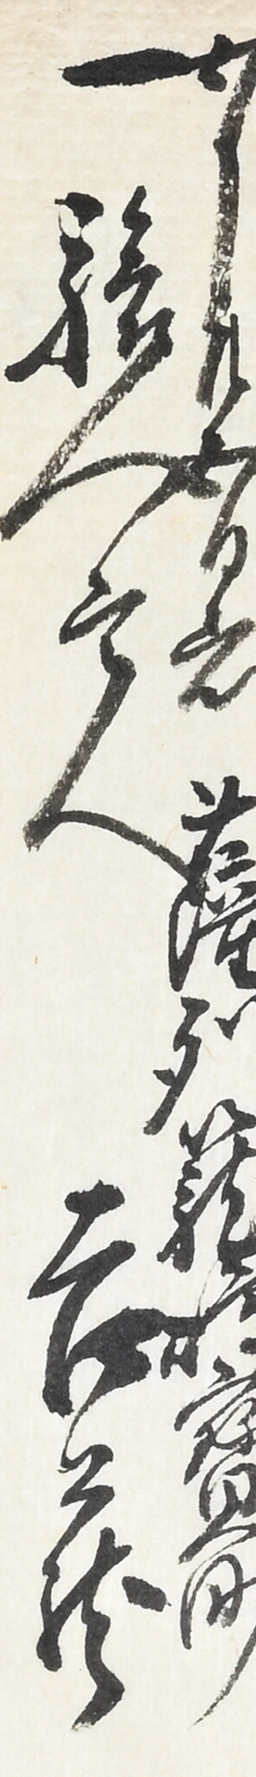一旅人壱人吉蔵
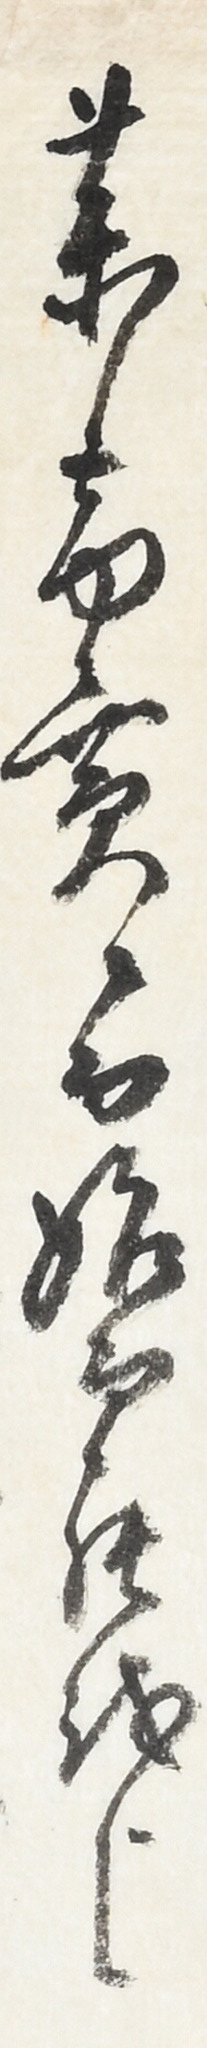薬商売ニ而始而罷越申候
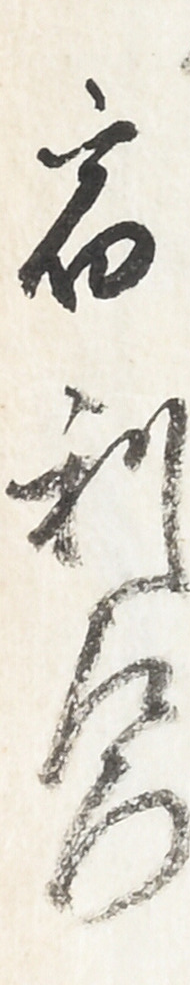宿利左衛門

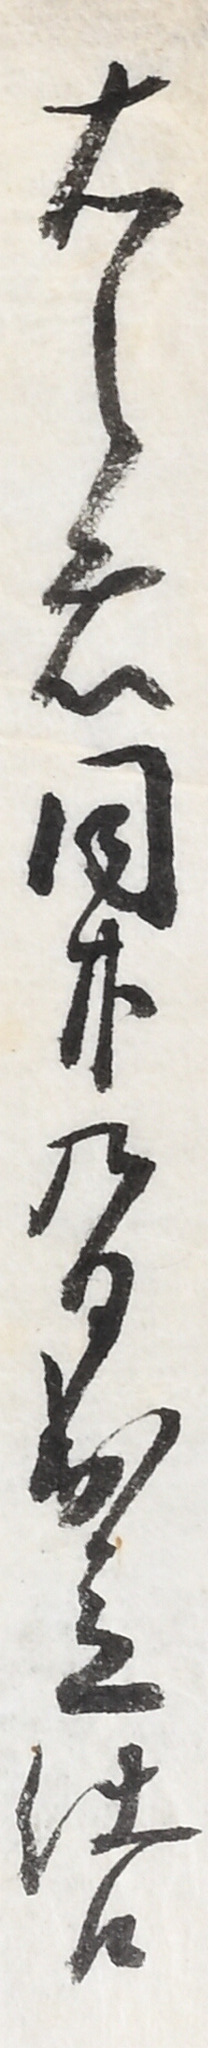右之者同廿九日出立仕候
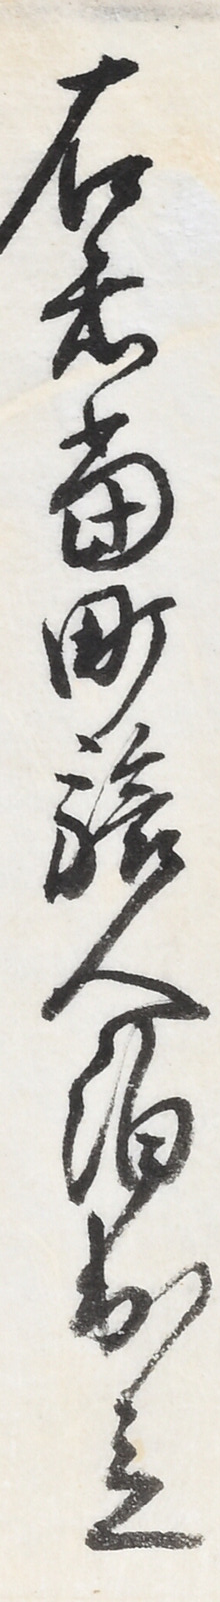右者当町旅人泊出立
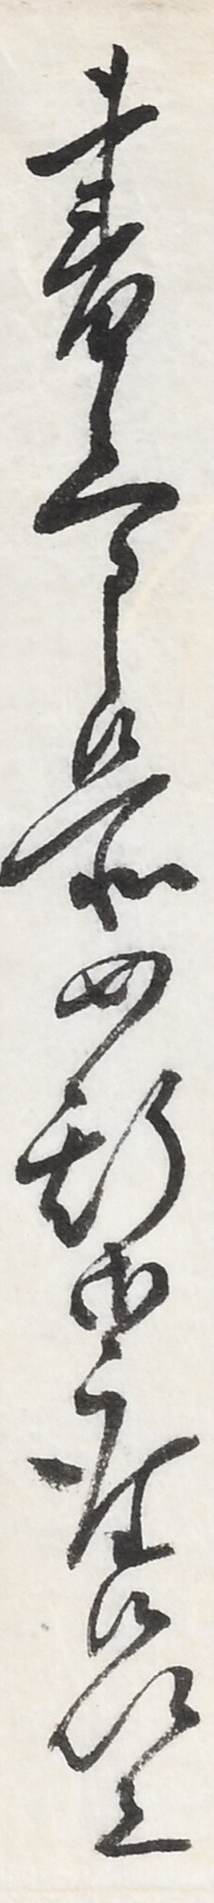書上申候所如斯御座候以上
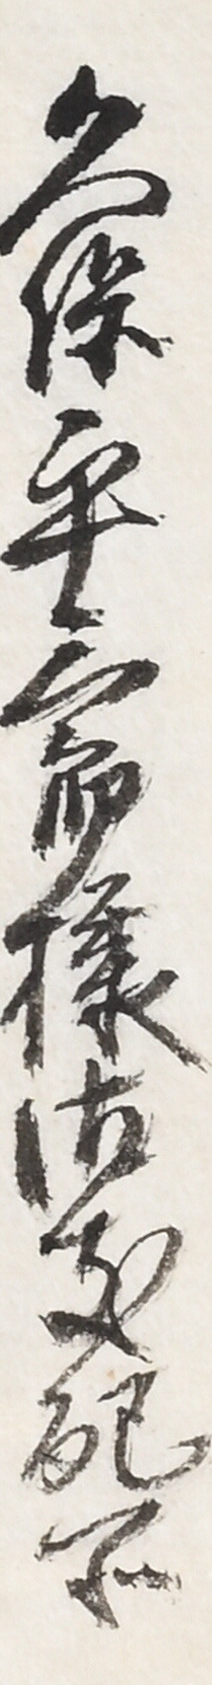久保平三郎様御支配所
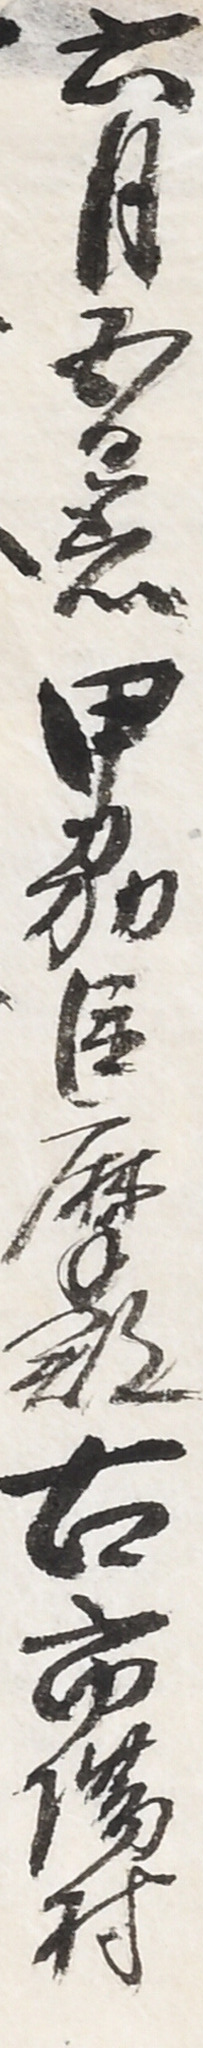六月五日着甲州巨摩郡古市場村
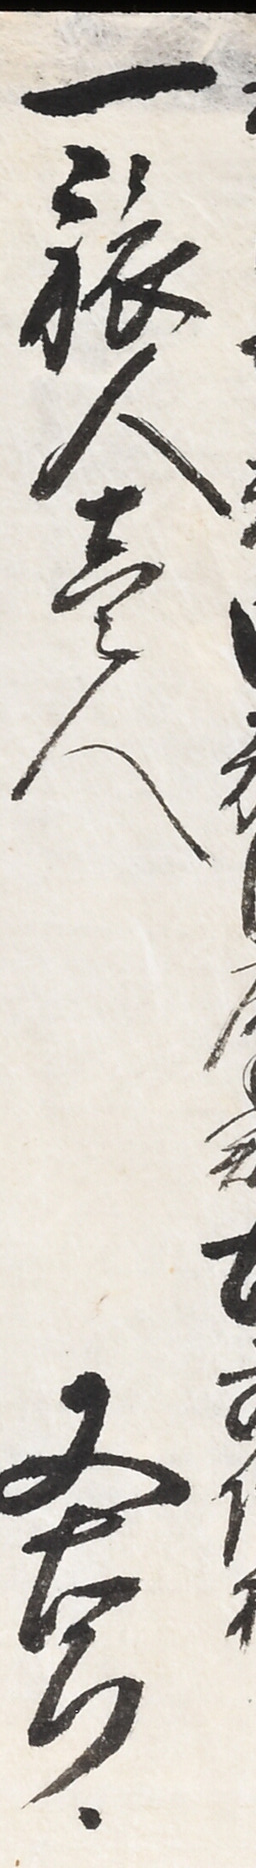一旅人壱人又右衛門・
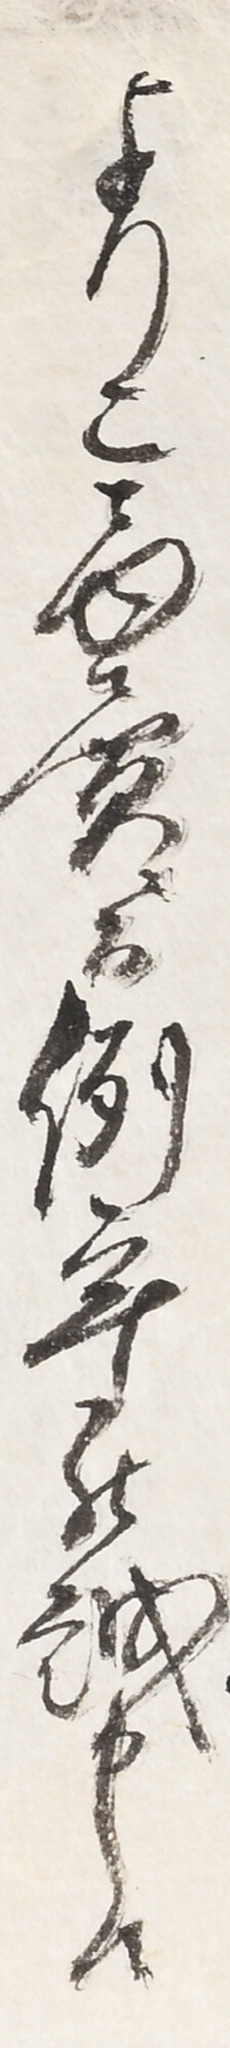よりこ商売ニ而例年罷越申候
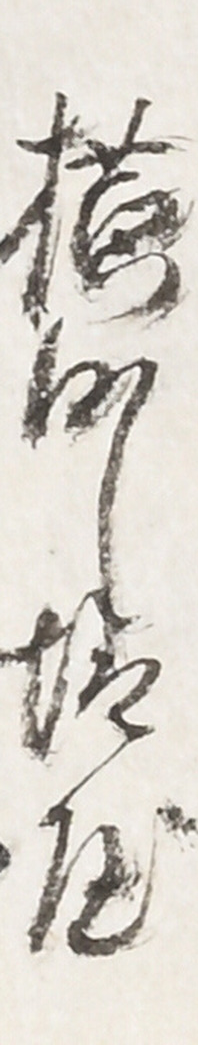横町塩屋
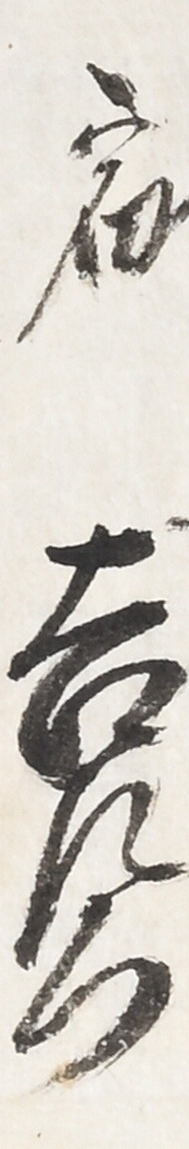宿吉左衛門
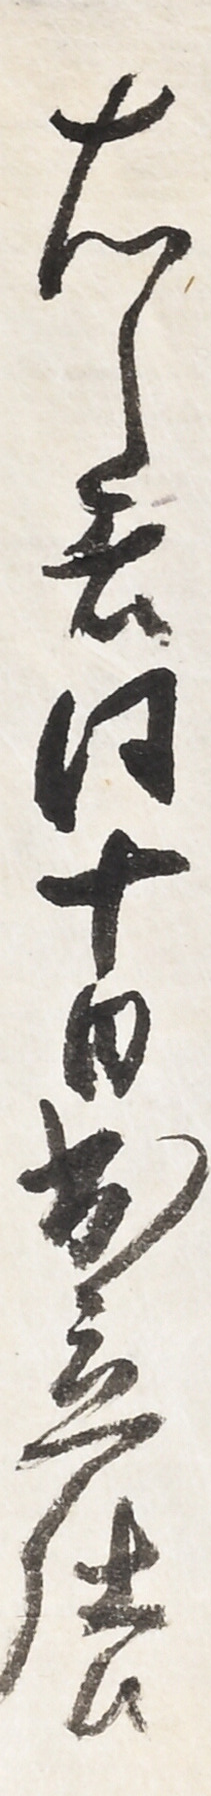右之者同十日出立仕候
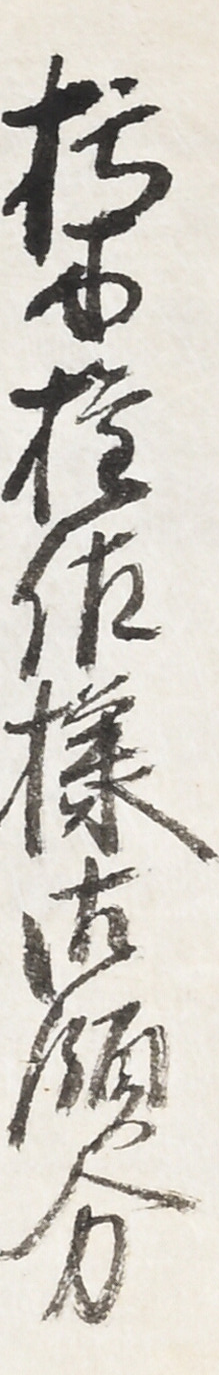朽木権佐様御領分
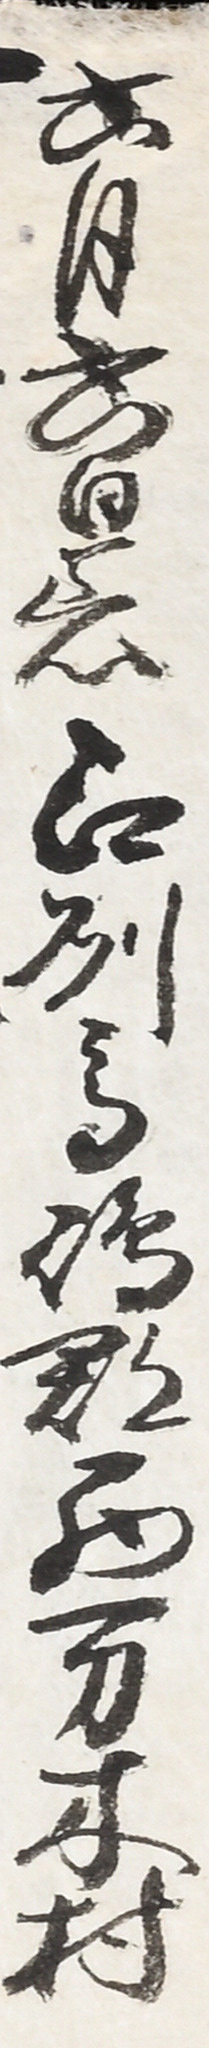六月六日着江州高嶋郡西万木村
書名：旅人泊控帳
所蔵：伊那市立高遠町図書館・合同会社AMANE
